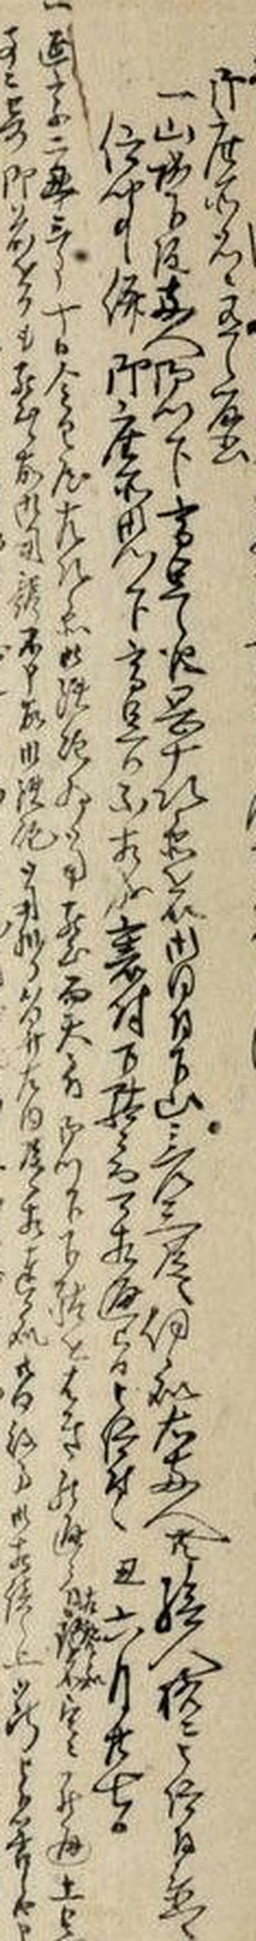仰聞候併御座所御門下高足は不相成裏付下駄に而可相通旨被仰付候丑六月廿七日
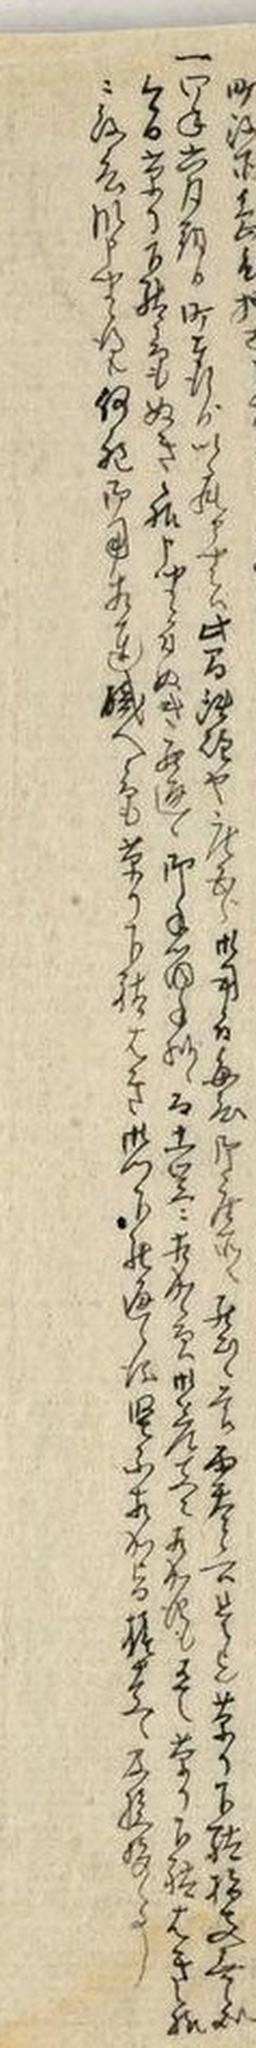に致度段申聞候へ共何程御用相達職人に而も草り下駄はき御門下罷通候儀堅不相成旨梶太夫へ及挨拶候事

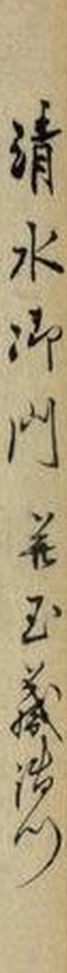清水御門并玉蔵御門
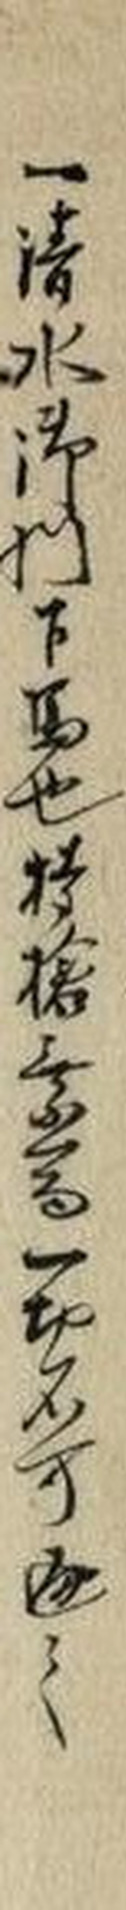一清水御門下馬也持槍乗馬一切不可通之
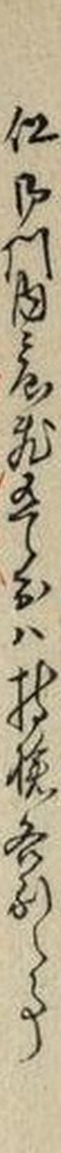但御門内に屋敷有之分は持槍各別之事
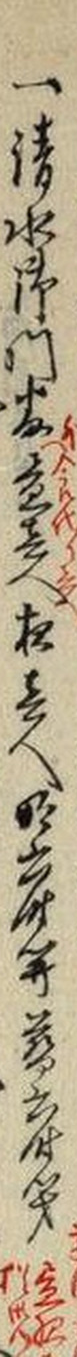一清水御門番昼壱人夜壱人明六時開暮六時閉
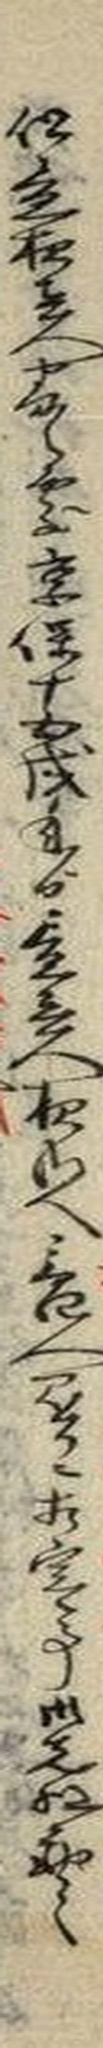但昼夜壱人番之処享保十五戌年ゟ昼壱人夜に弐人ニ而四人懸りに相定候事御先組勤之
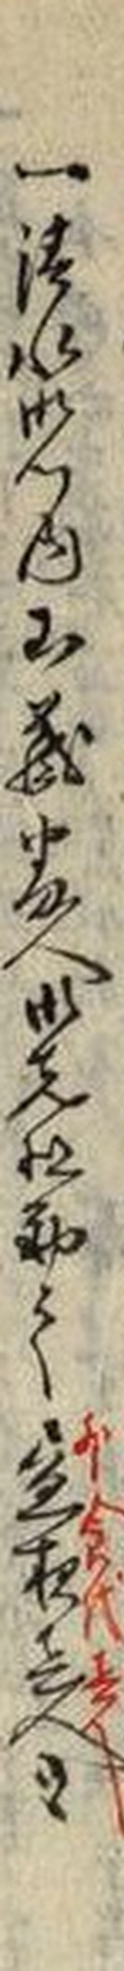一清水御門内玉蔵番人御先組勤之昼夜壱人つゝ
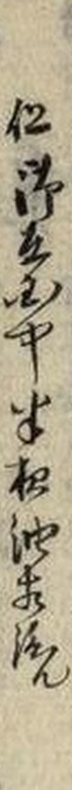但御在国中半夜油相渡ル
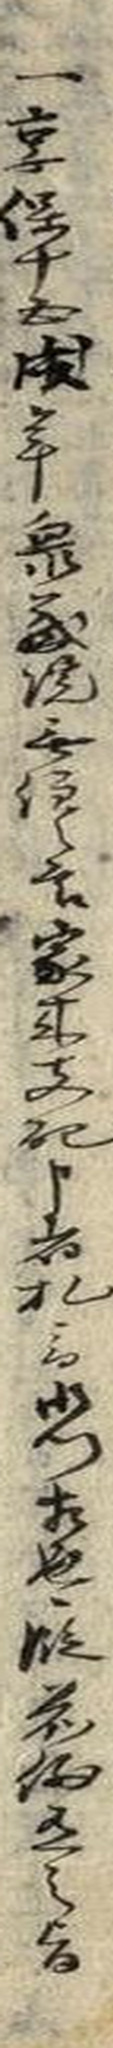一享保十五戌年泉蔵院無住之節家来支配申者札に而御門相通候段前例有之旨
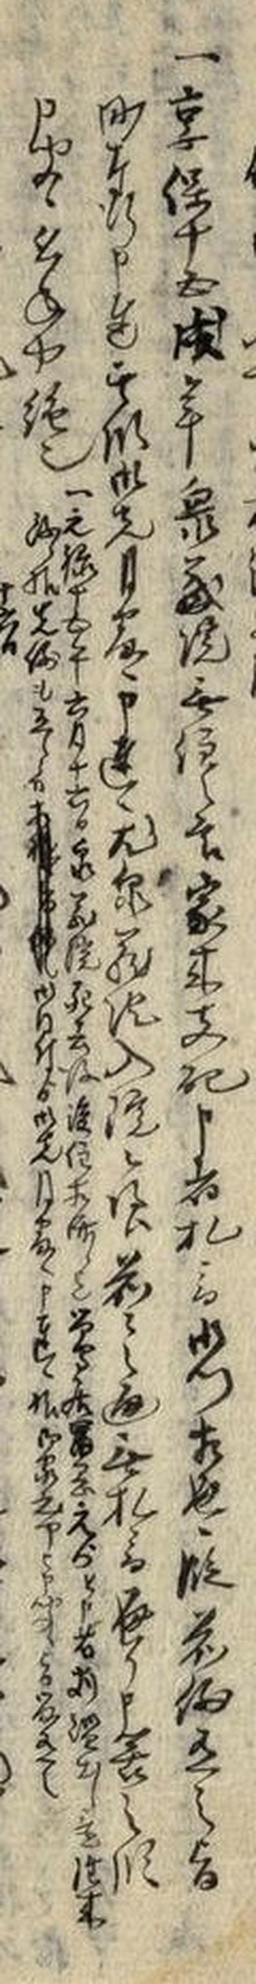町奉行申達其段御先月番へ申達候尤泉蔵院入院候得は前々之通無札に而通り申筈之段
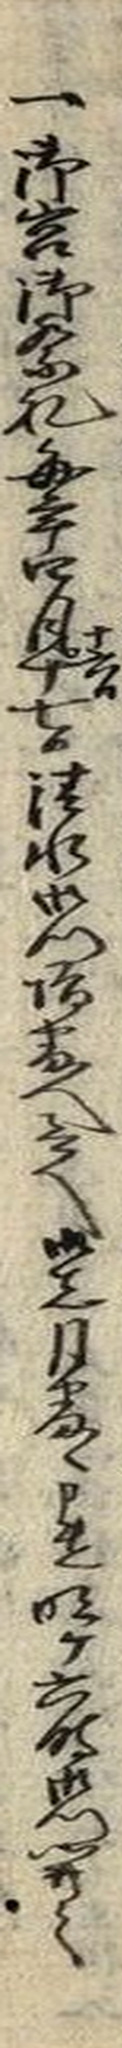一御宮御祭礼毎年四月十六日十七日清水御門増番人壱人御先月番へ申遣明ケ六時御門開之
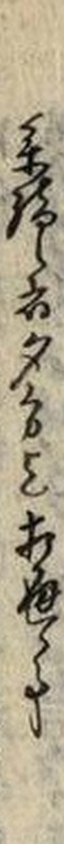参詣之者夕方まで相通候事
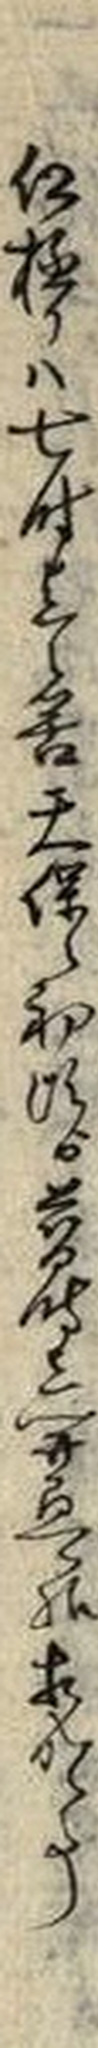但極りは七時迄之筈天保之初頃ゟ暮時迄開置候様相成候事
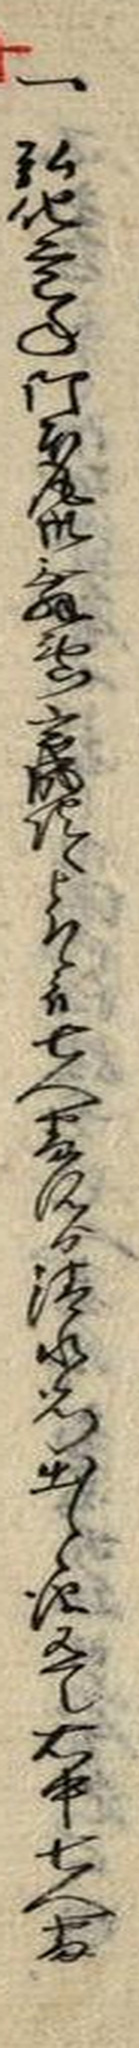一弘化二己年御本丸御舞台玄成院へ被下候に付七人番所ゟ清水御門へ出候儀有之右中七人番

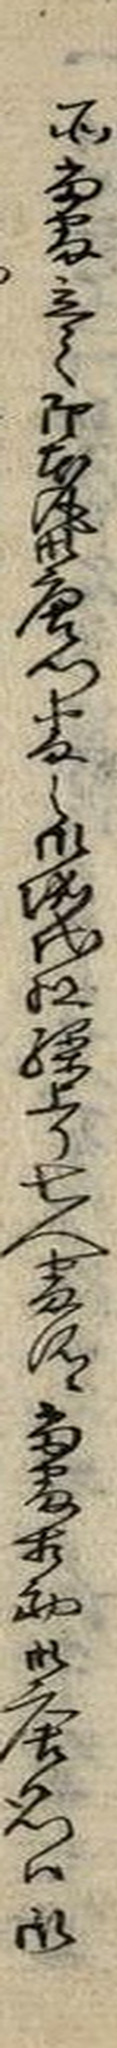所当番立之御本丸御唐御門番之御城代組繰上り七人番所へ当番相勤御唐御門は御
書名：御門御櫓之部
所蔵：福井県文書館 Fukui Prefectural Archives
